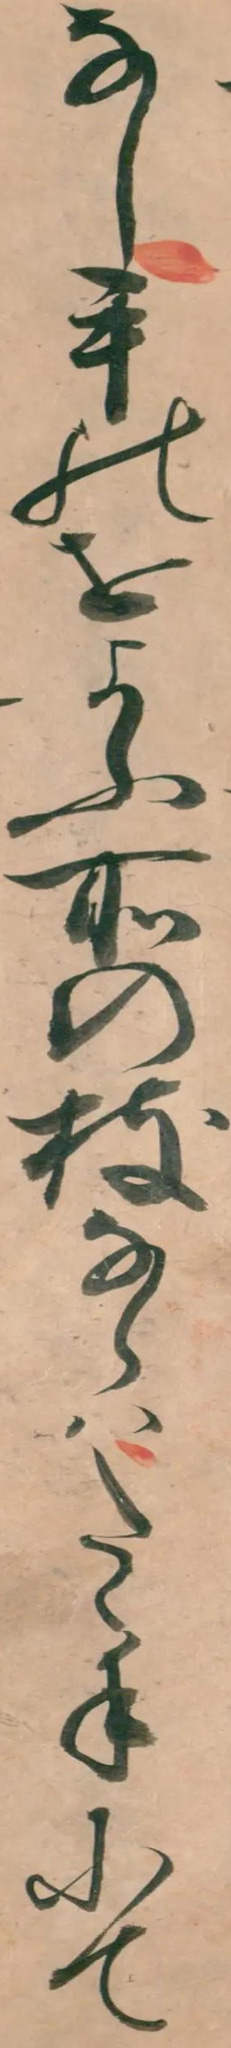なし手のをよふ所の枝ならハたゝ手にて
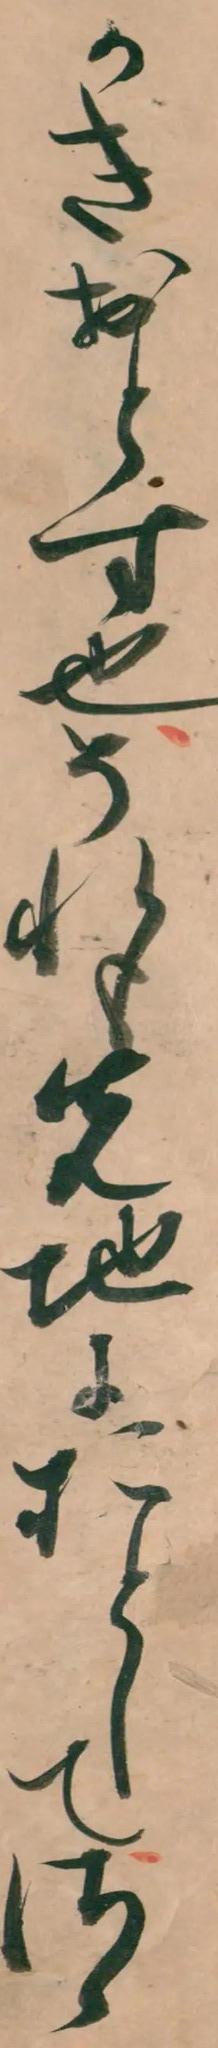かきおとす也それも先地におとしてさら
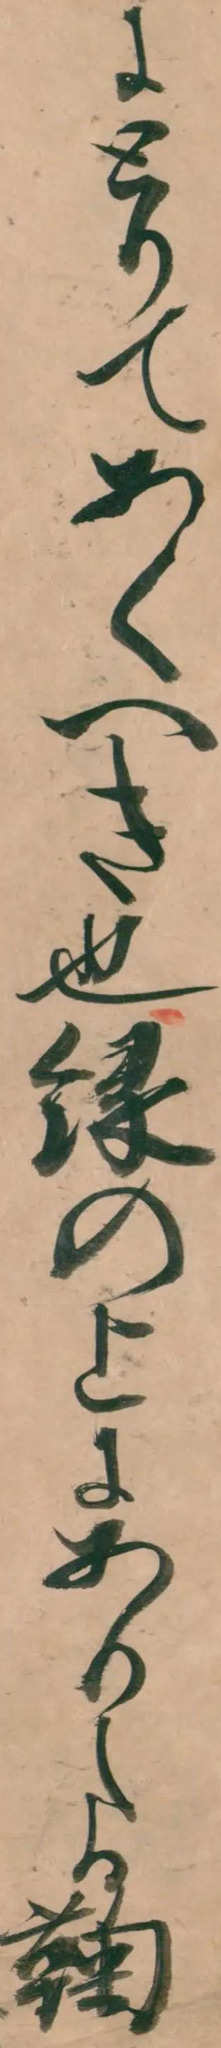にとりてあくへき也縁の上に有りたる鞠も

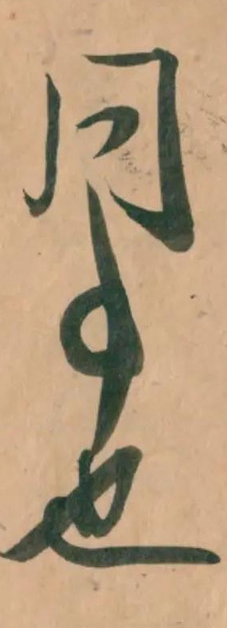同事也
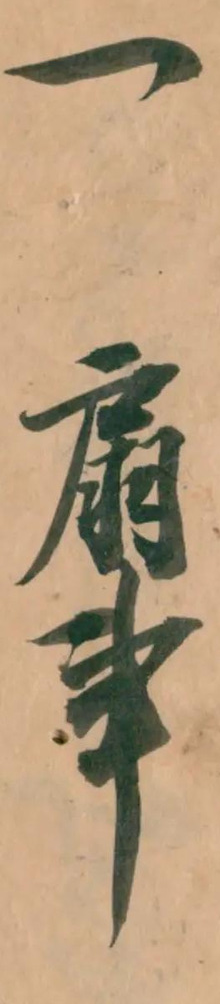一扇事
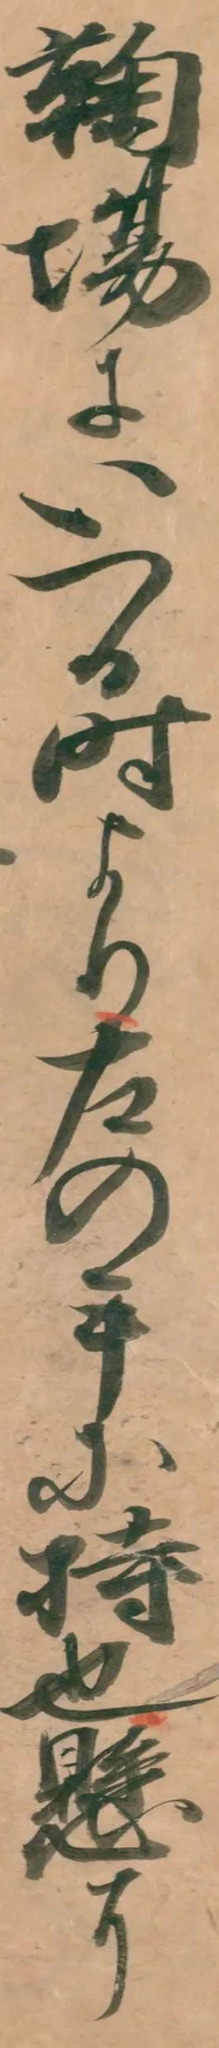鞠場にいつる時より左の手に持也懸に
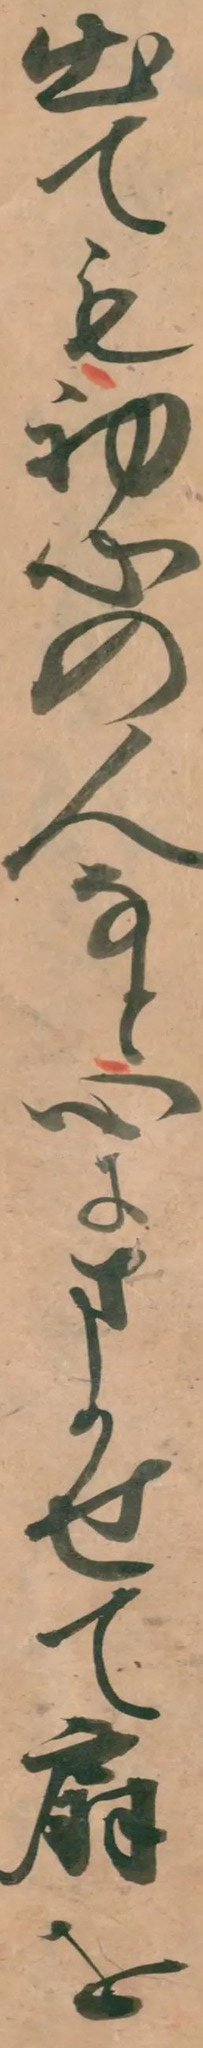出ても初心の人なと心にまかせて扇を
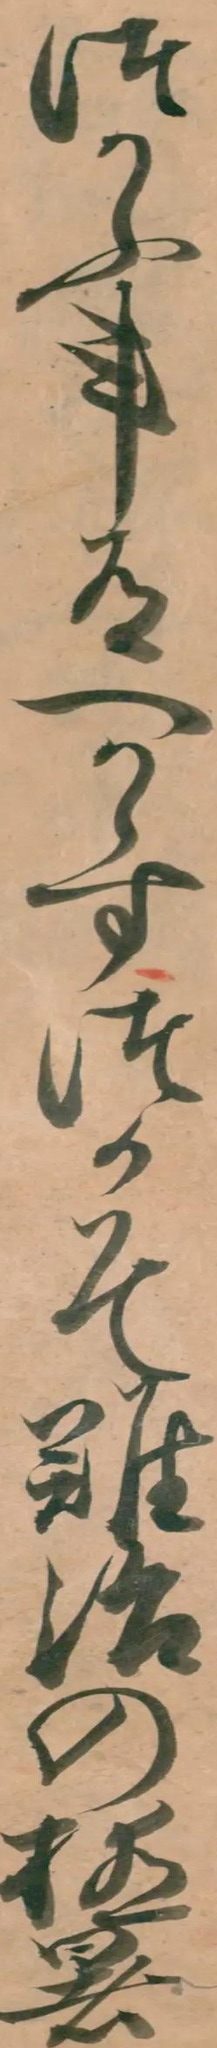つかふ事有へからすつかハて難治の極暑
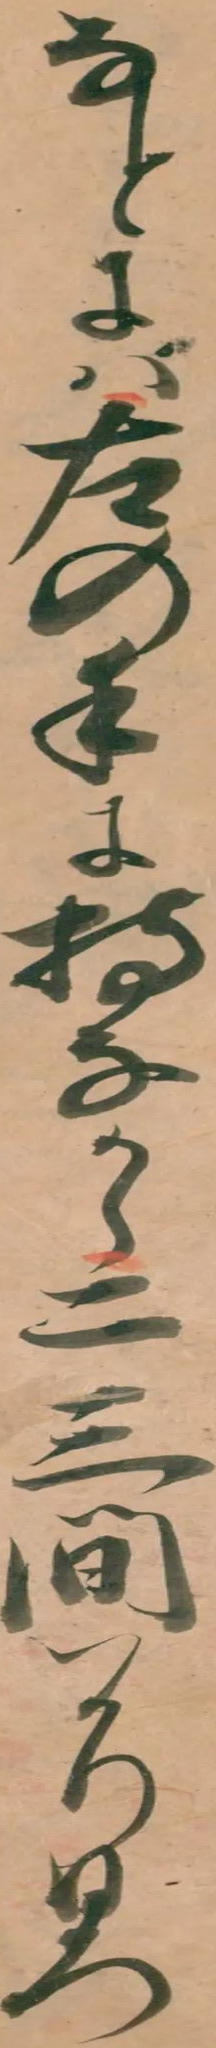なとにハ左の手に持なから二三間ハかりひろ
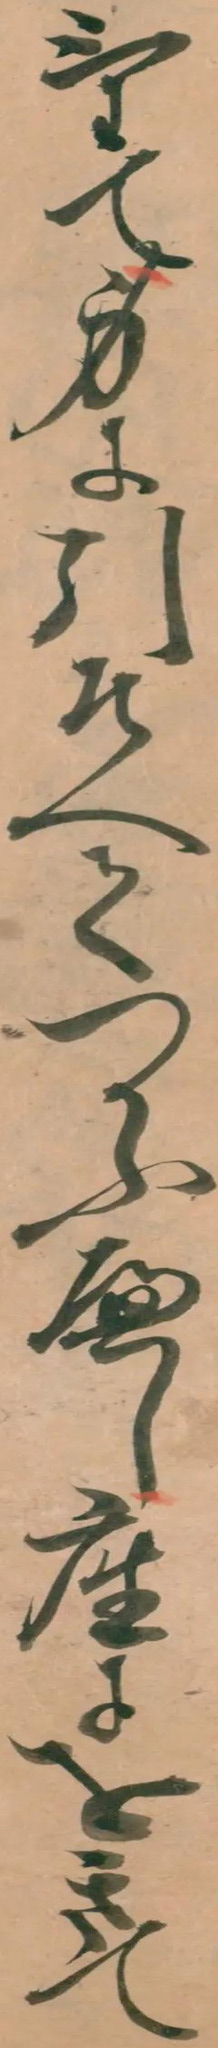けて身に引そへてつかふへし座にをきて
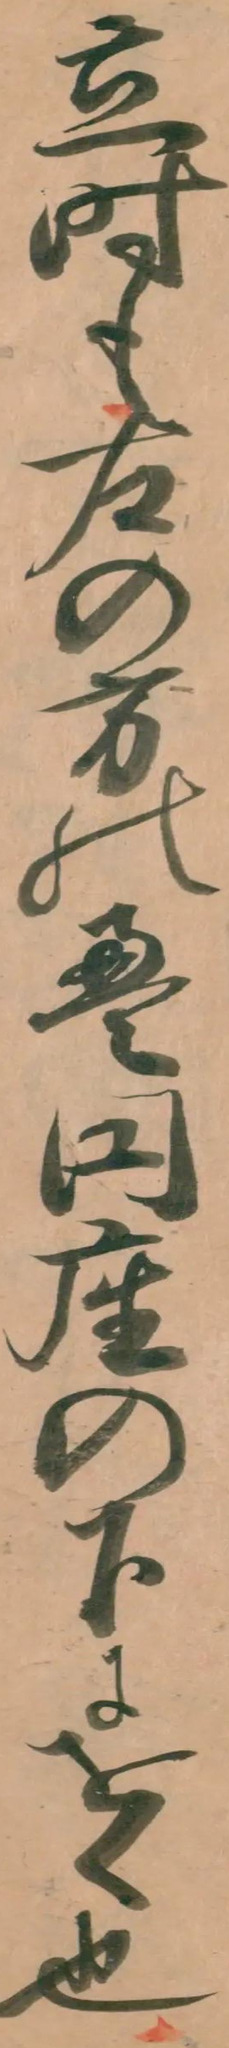立時も左の方の畳円座の下にをく也
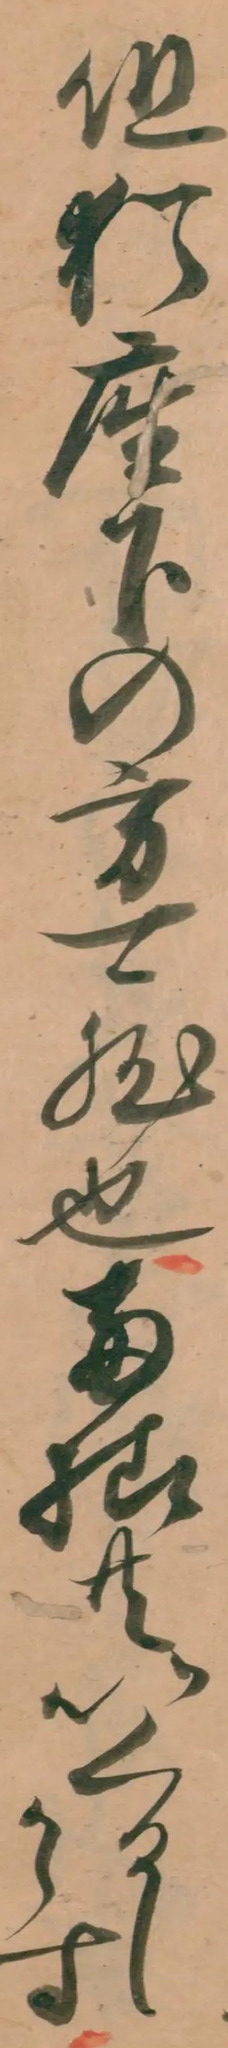但猶座下の方可然也両様共以くるしからす
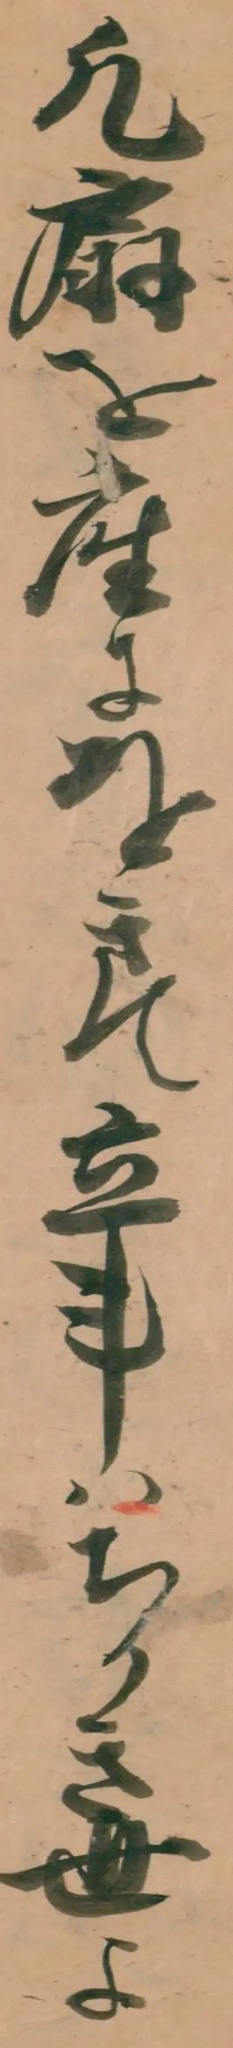凡扇を座にをきて立事ハちかき世よ
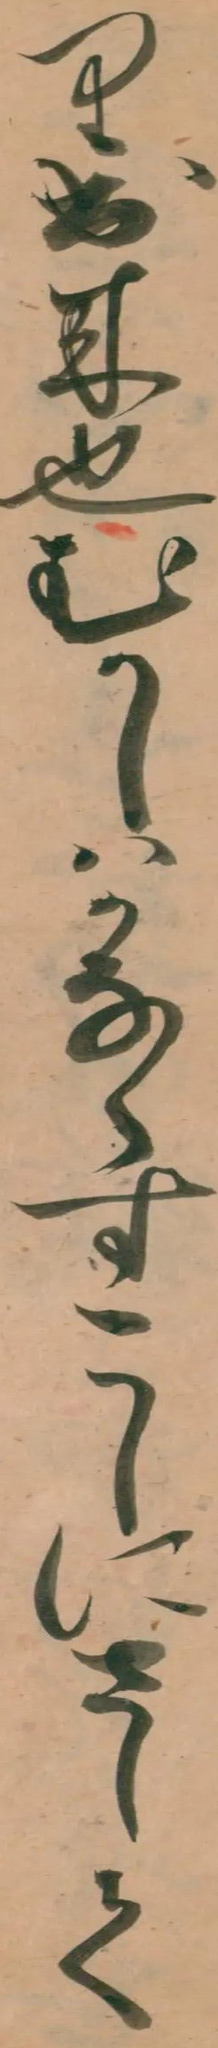り出来也むかしハかならすこしにさして
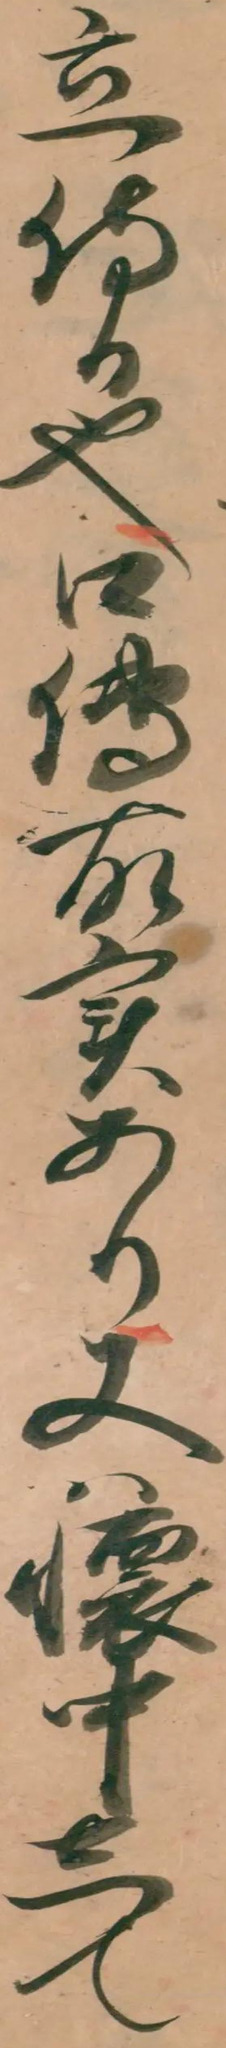立侍る也口伝故実あり又懐中して
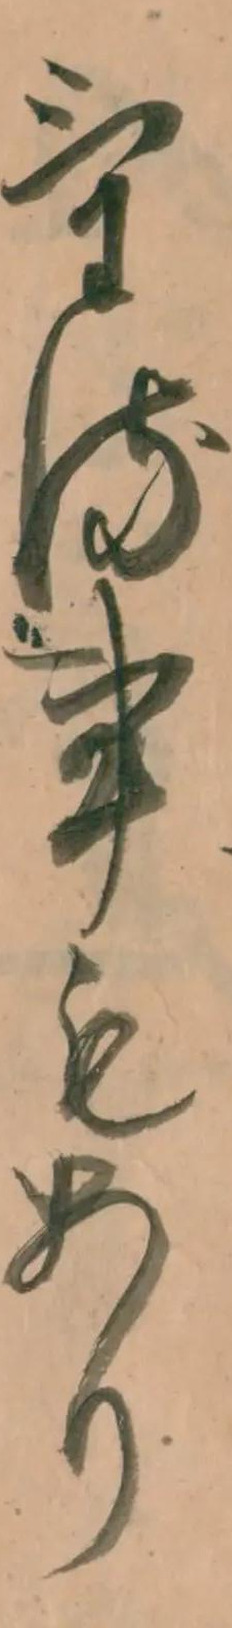ける事もあり
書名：蹴鞠之条々大概
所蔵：国立国会図書館 National Diet Library, JAPAN
